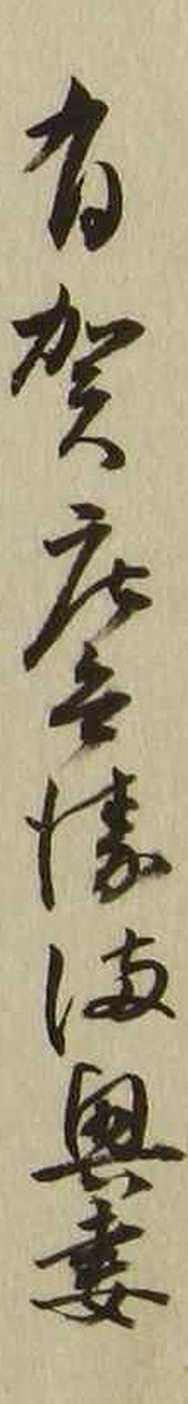女有賀庄兵衛満興妻
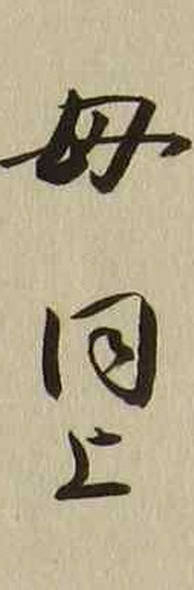母同上
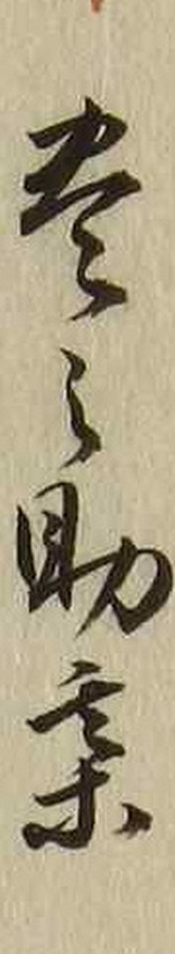豊之助某
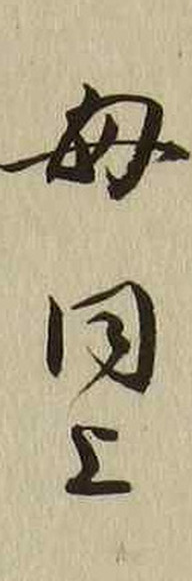母同上
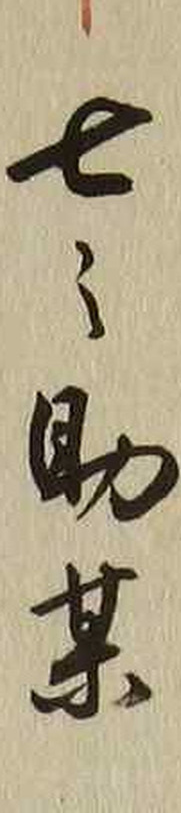七之助某
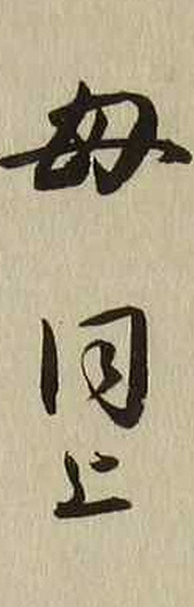母同上
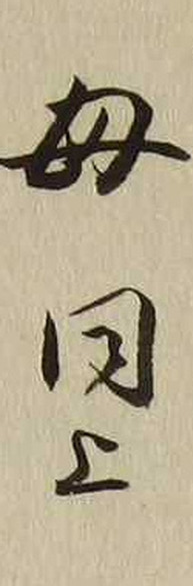母同上
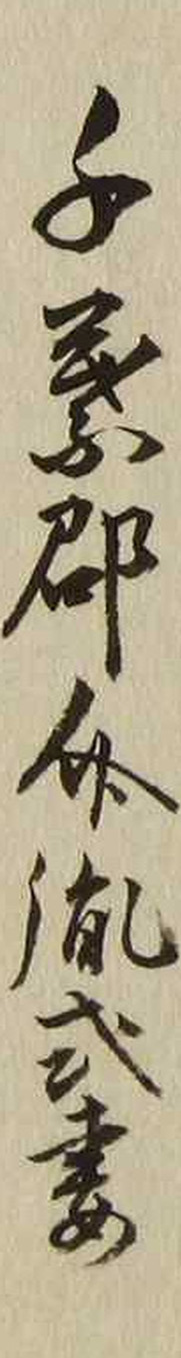女千葉郡介胤式妻
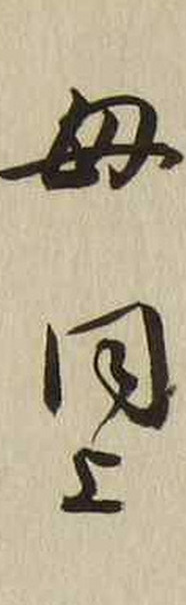母同上

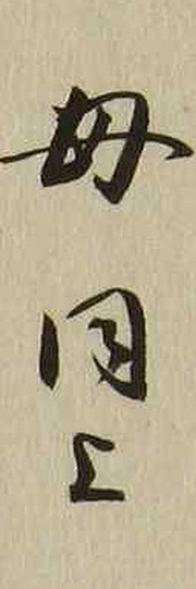母同上
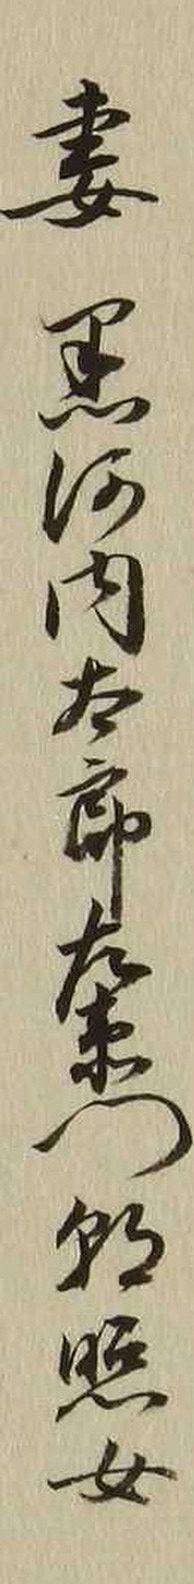妻黒河内太郎左衛門朝照女
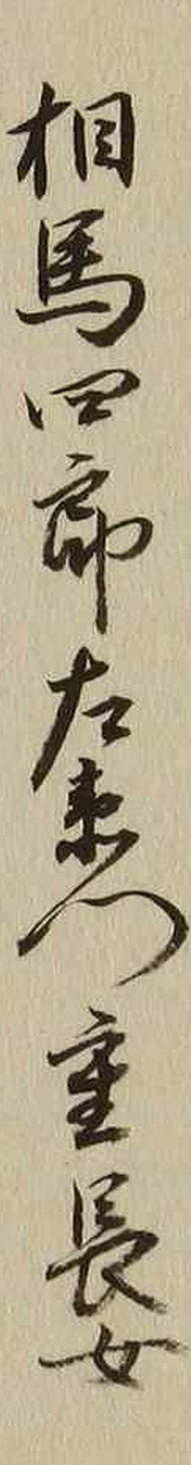相馬四郎左衛門重長女
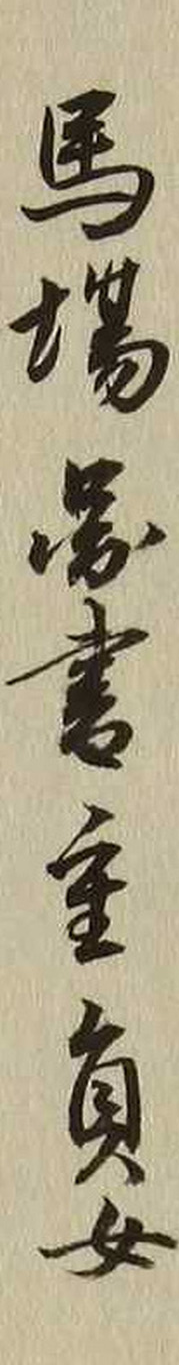馬場図書重員女
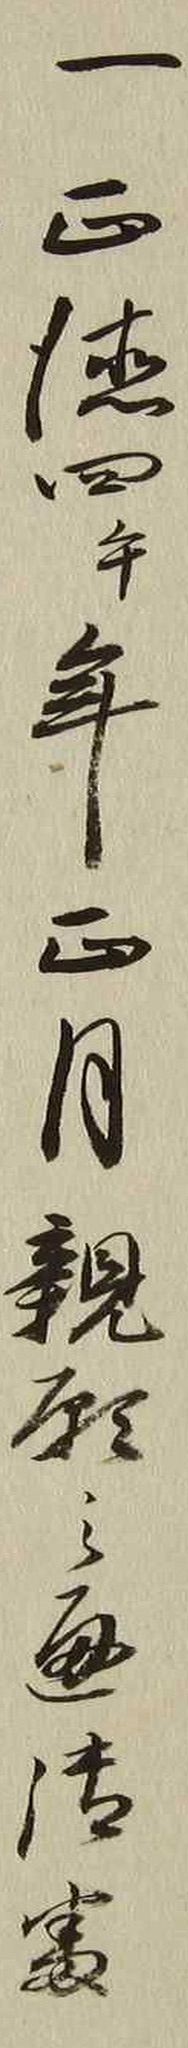一正徳四午年正月親願之通御番
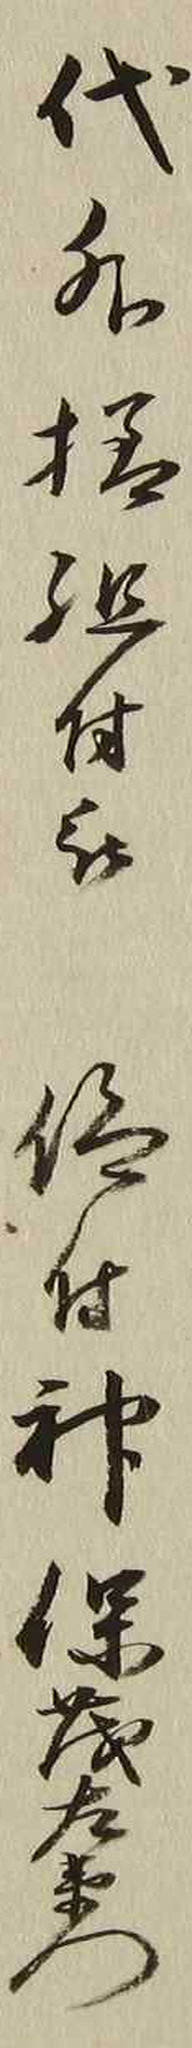代外様組付被仰付神保茂左衛門
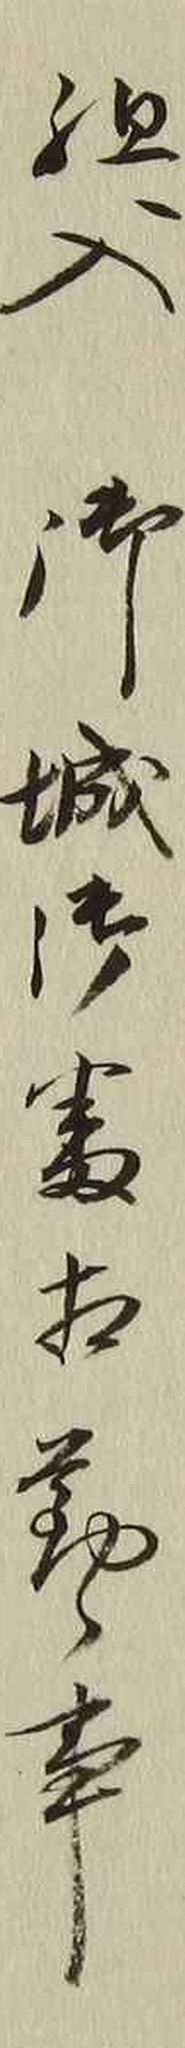組へ入御城御番相勤候事
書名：諸士系譜　巻之69　を之部3
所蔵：会津若松市立会津図書館
